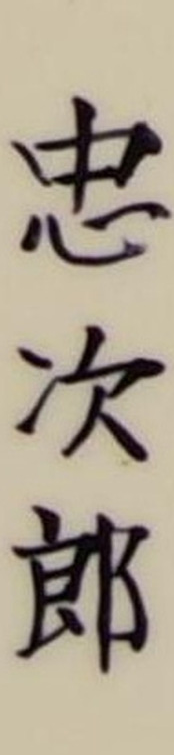忠次郎
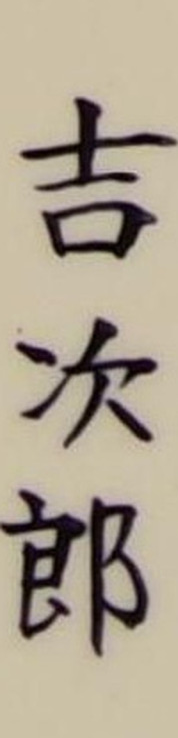吉次郎
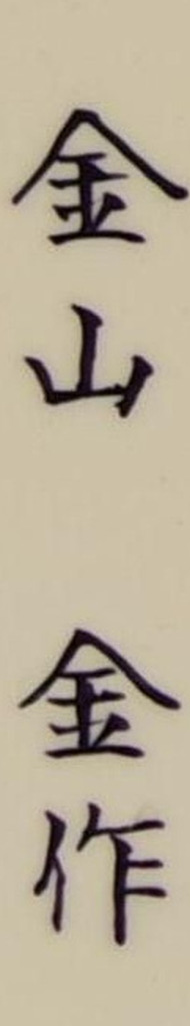金山金作
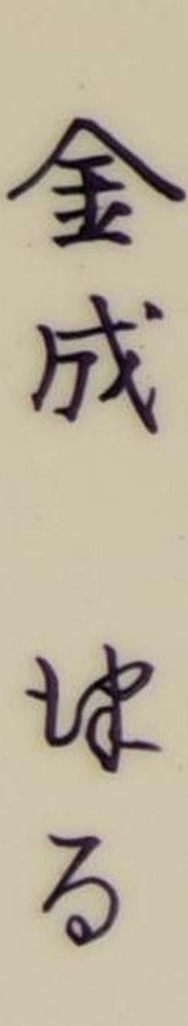金成つる

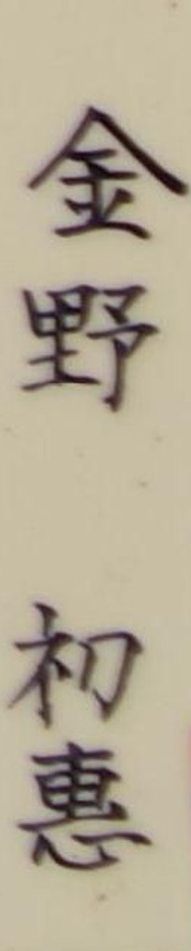金野初恵
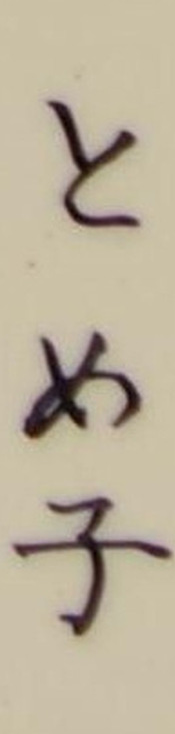とめ子
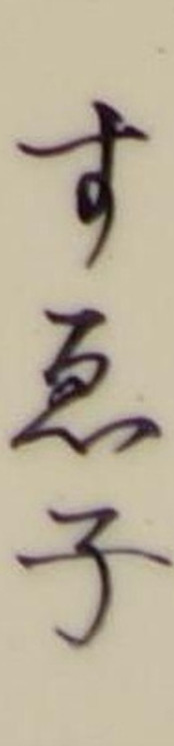すゑ子
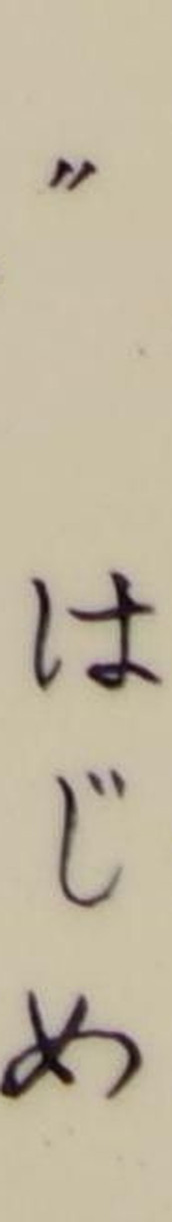はじめ
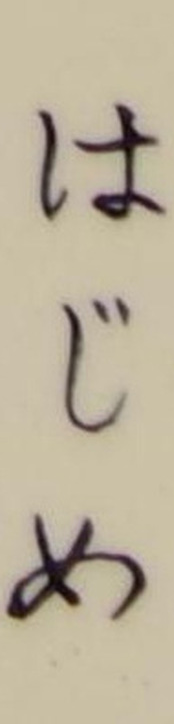はじめ
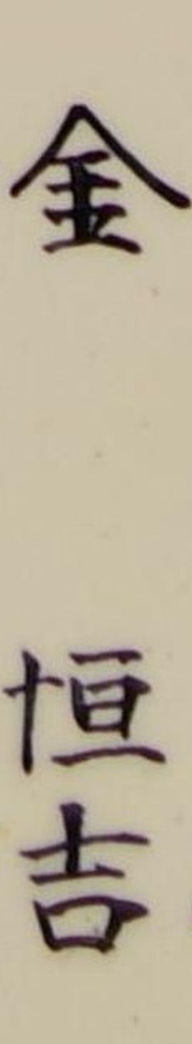金恒吉
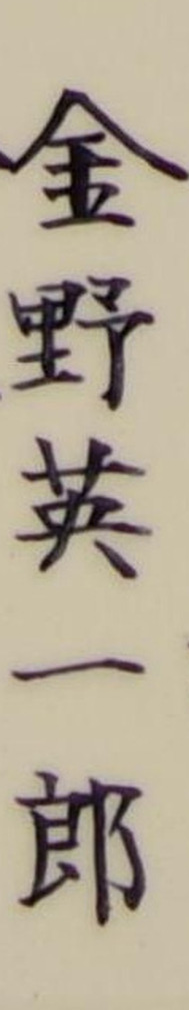金野英一郎
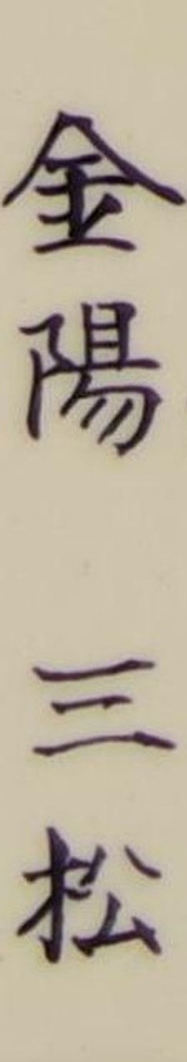金陽三松
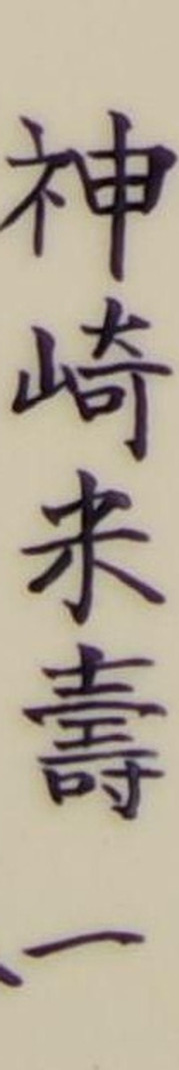神崎米壽一

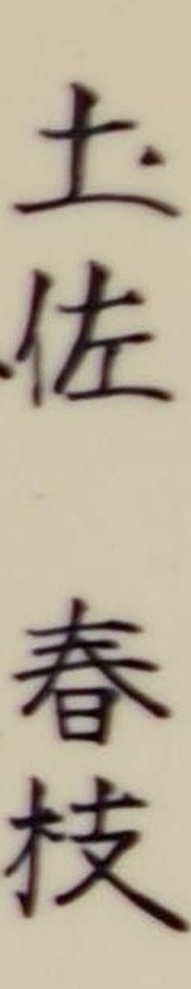土佐春枝
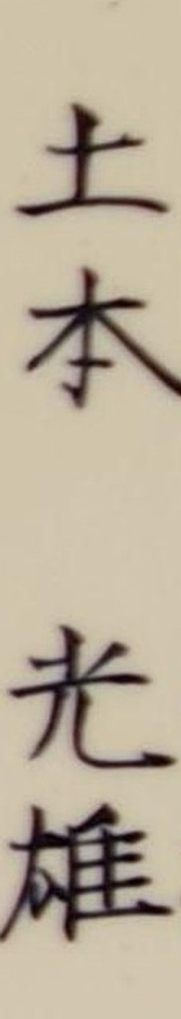土本光雄
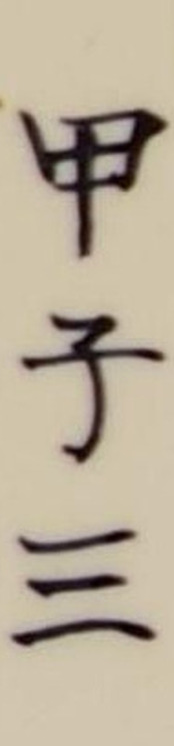甲子三
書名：A~D
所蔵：koyasan kongobuji
